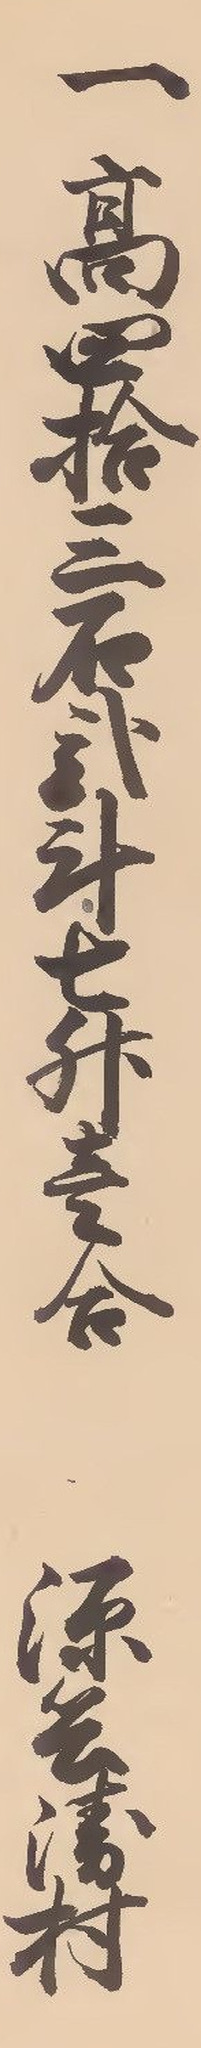一高四拾三石弐斗七升壱合源兵衛村
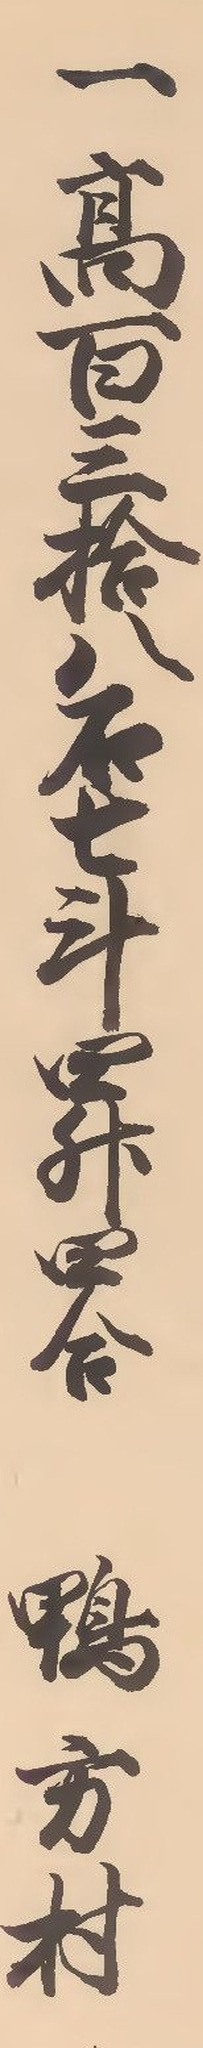一高百三拾八石七斗四升四合鴨方村
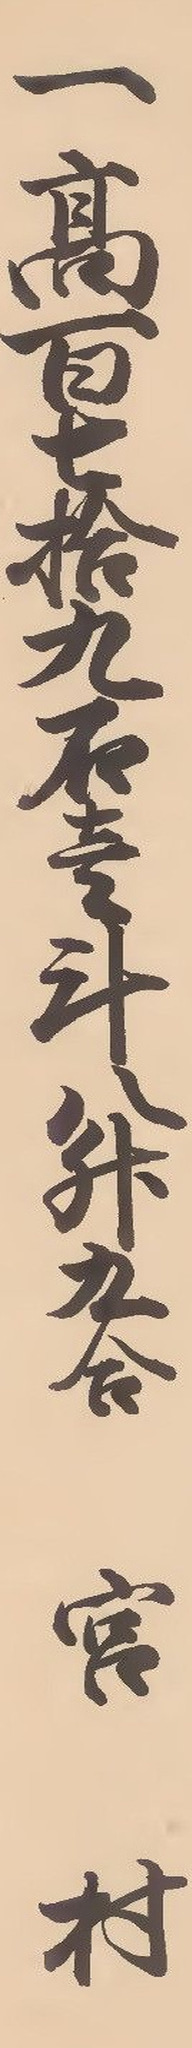一高百七拾九石壱斗八升九合宮村
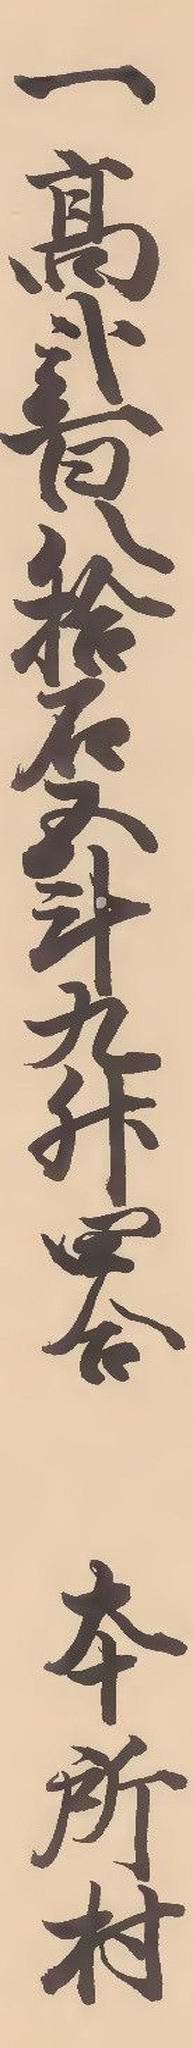一高弐百八拾石五斗九升四合本所村
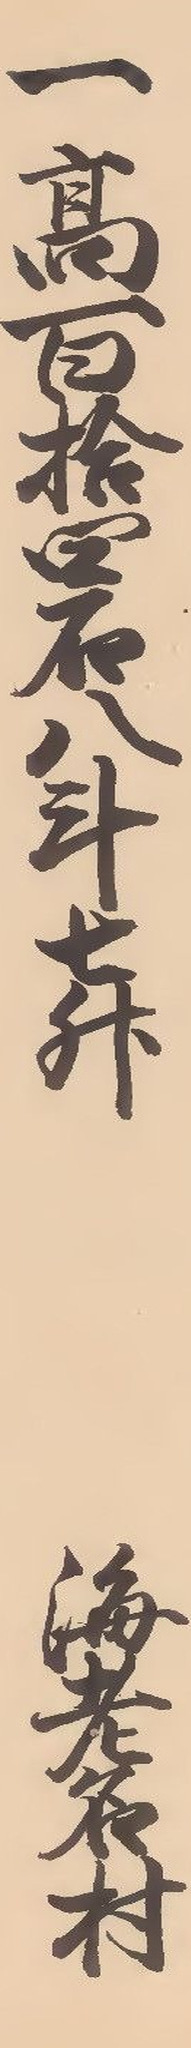一高百拾四石八斗七升海老名村
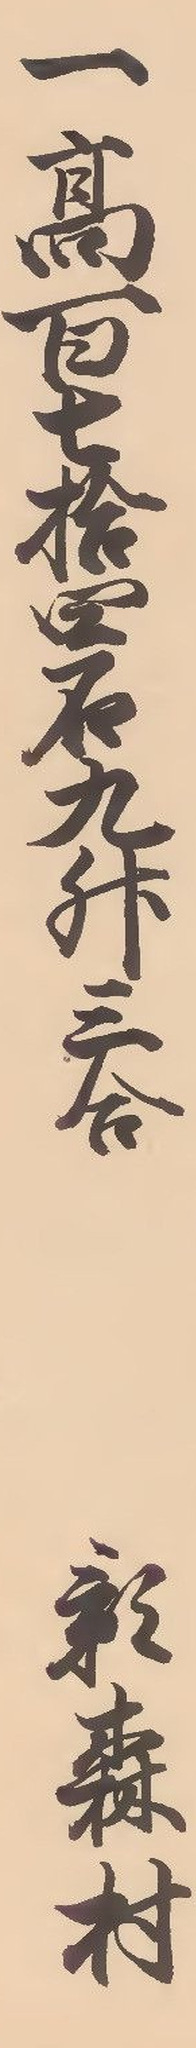一高百七拾四石九升三合影森村

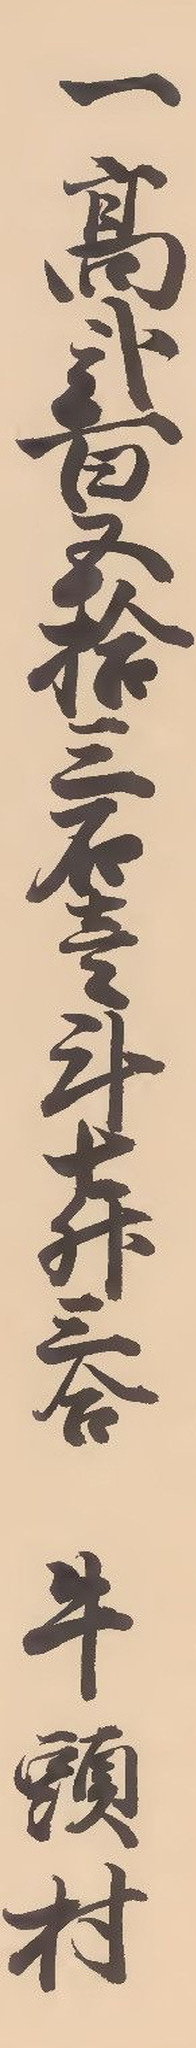一高弐百五拾三石壱斗七升三合牛頭村
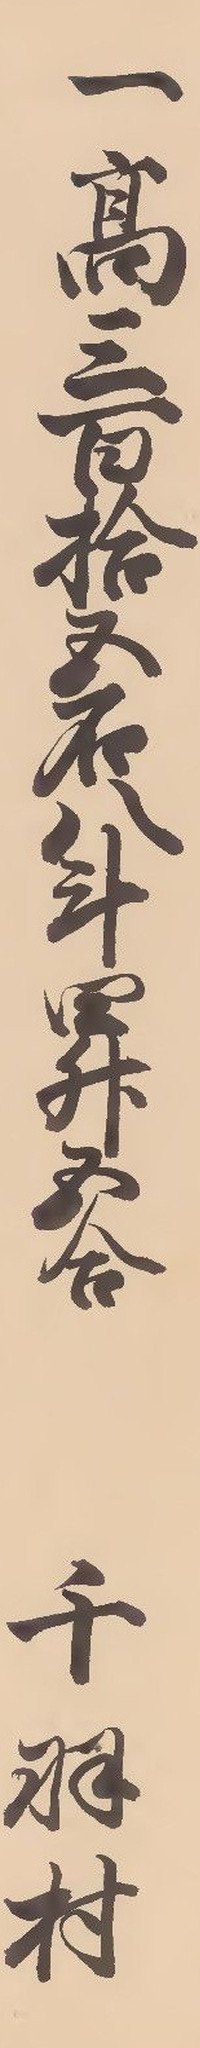一高三百拾五石八斗四升五合千羽村
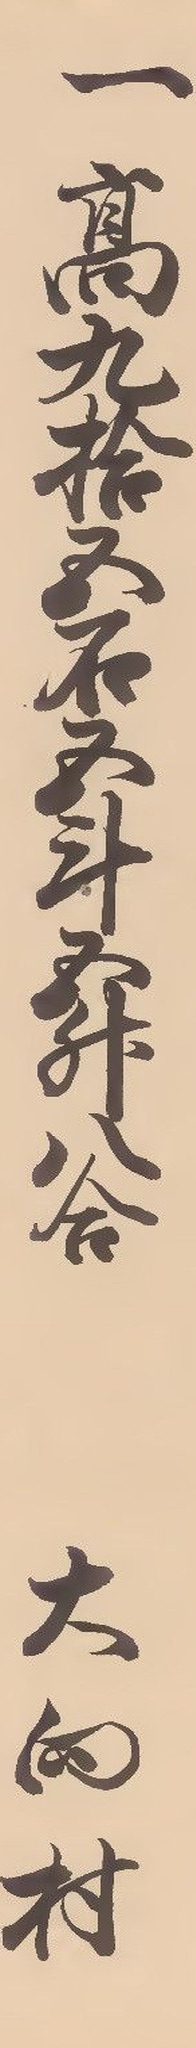一高九拾五石五斗五升八合大向村
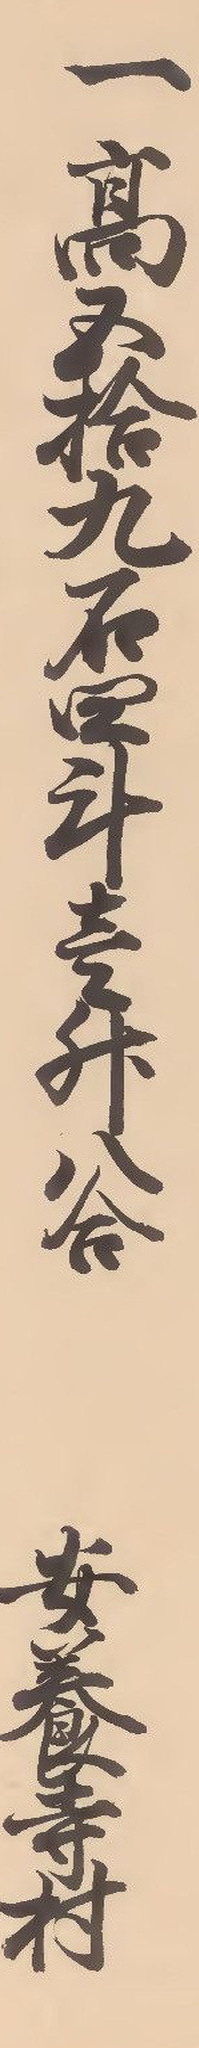一高五拾九石四斗壱升八合安養寺村
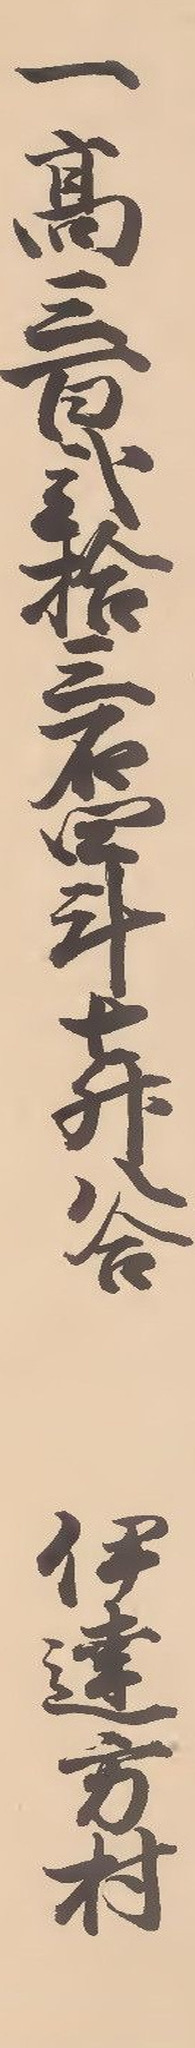一高三百弐拾三石四斗七升八合伊達方村
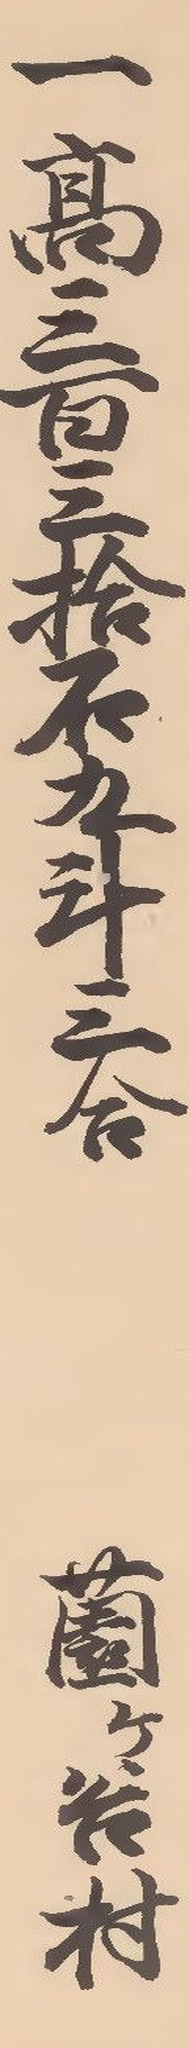一高三百三拾石九斗三合薗ヶ谷村
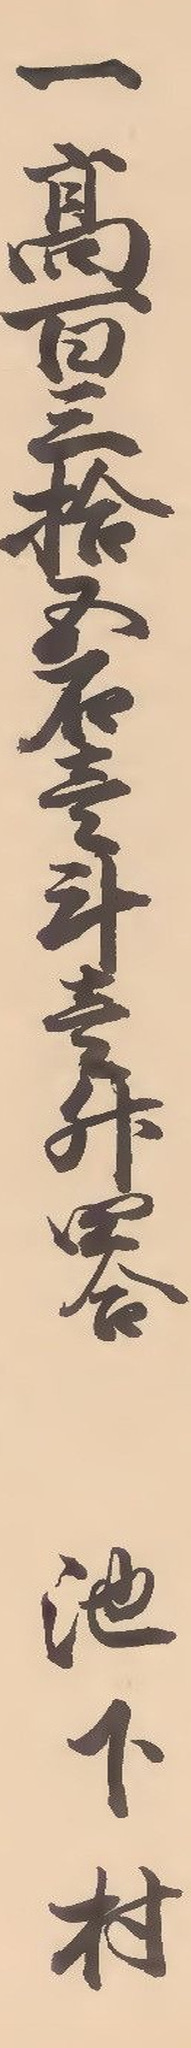一高百三拾五石壱斗壱升四合池下村

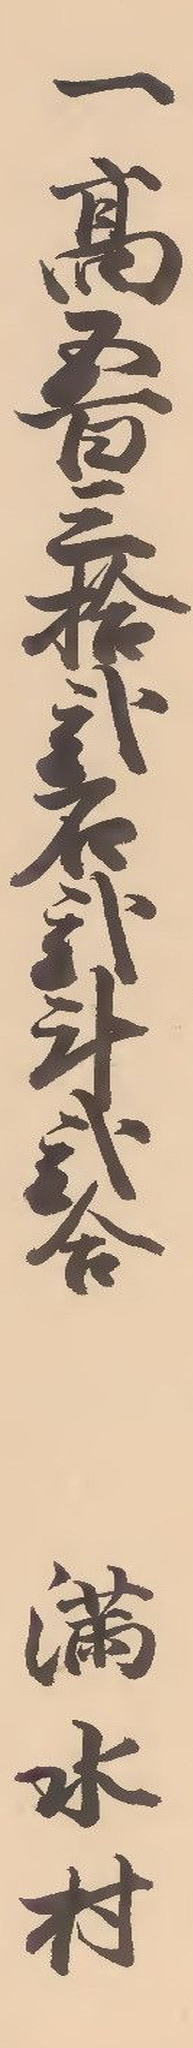一高五百三拾弐石弐斗弐合満水村
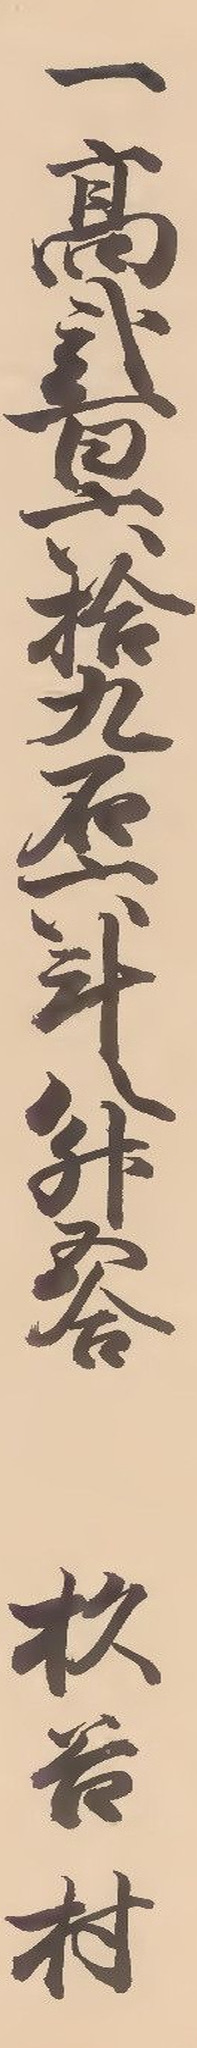一高弐百六拾九石六斗八升五合杉谷村
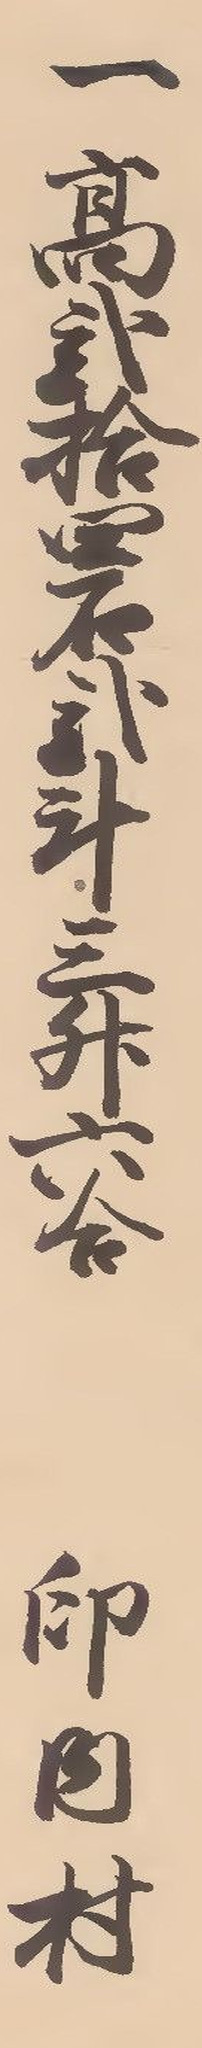一高弐拾四石弐斗三升六合印内村
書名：遠江国郷帳
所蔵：国立公文書館 National Archives of Japan
